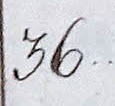36
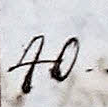40
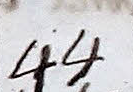44
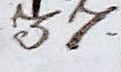37
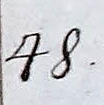48
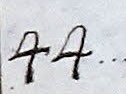44
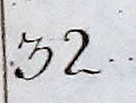32
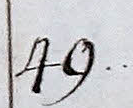49
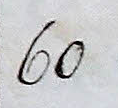60
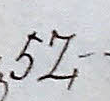52
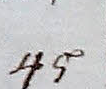45
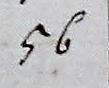56
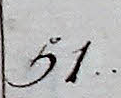51
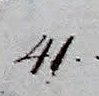41
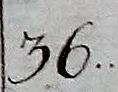36
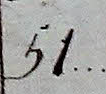51
